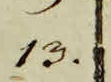13.
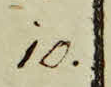10.
